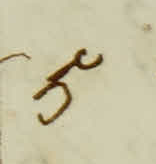5
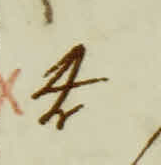4
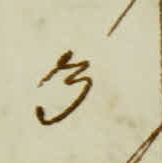3
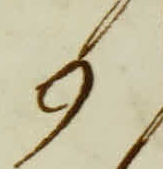9
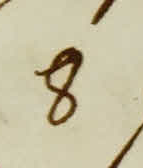8
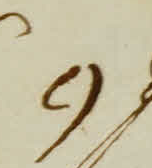9
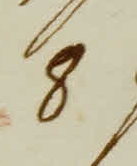8
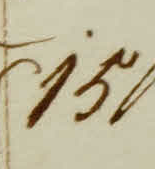15
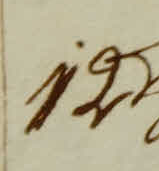12
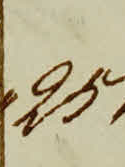25
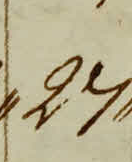27
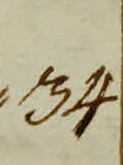34
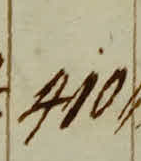410
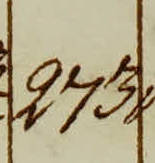273
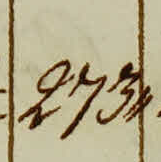273
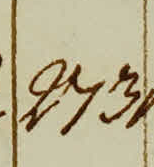273
